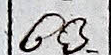63
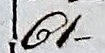61
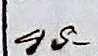45
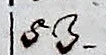53
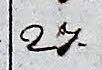27
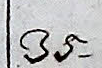35
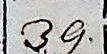39.
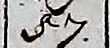57.
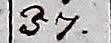37.
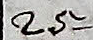25
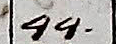44.
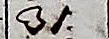31.
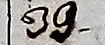39
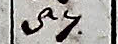57.
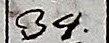34.
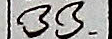33
